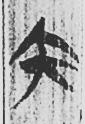內
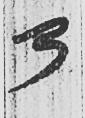乃
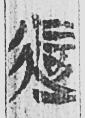{辶石}
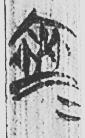齊=
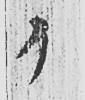人
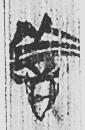善
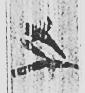之
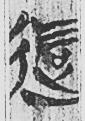{辶石}
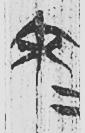宋=
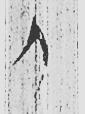人
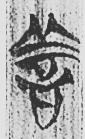善
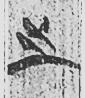之
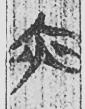亦
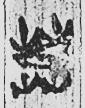莫
